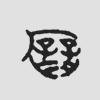{厂孖日}
